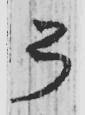乃
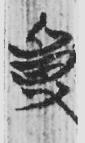尃
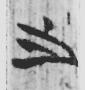之
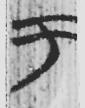于
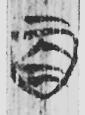百
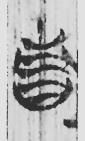青
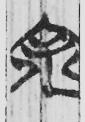余
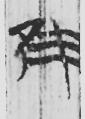隹
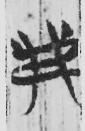弗
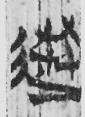{辶共}
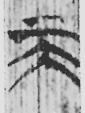天
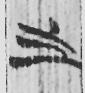之
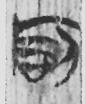叚
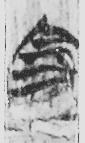命
